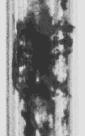庶
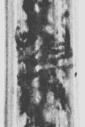神
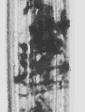是
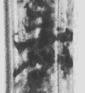亓
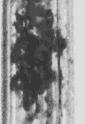惃
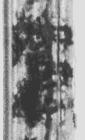{月次心}
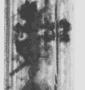于
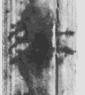我
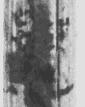邦
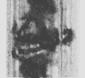㠯（以）
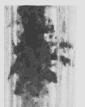不
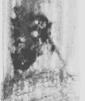右
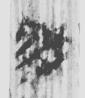我
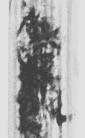事
